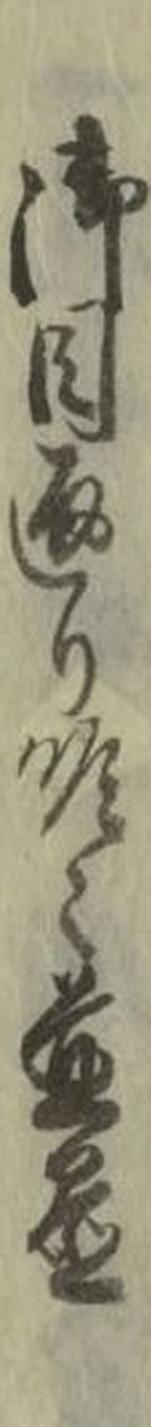御目通り順々並置
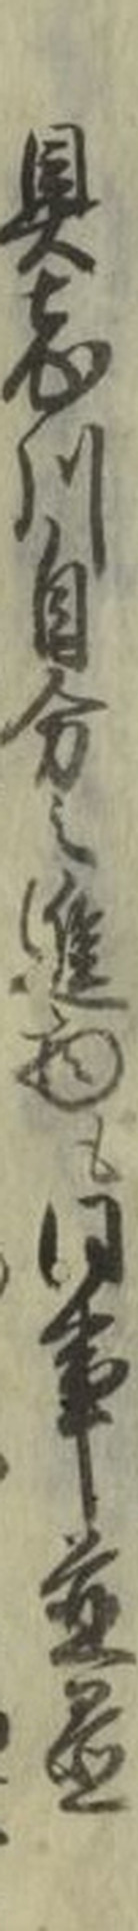具志川自分之進物も同事並置
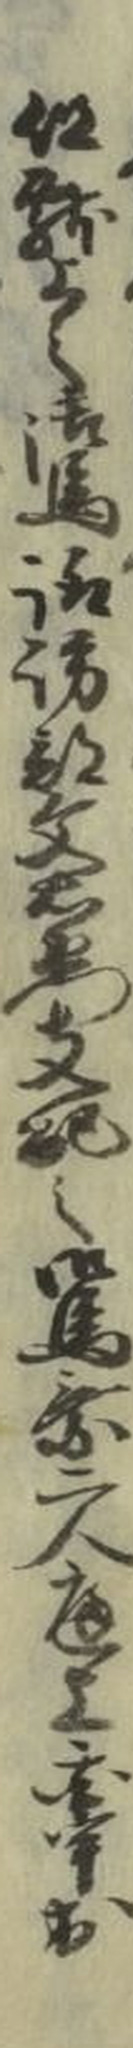但献上之御馬諏訪部文右衛門支配之御馬乗二人庭上牽出
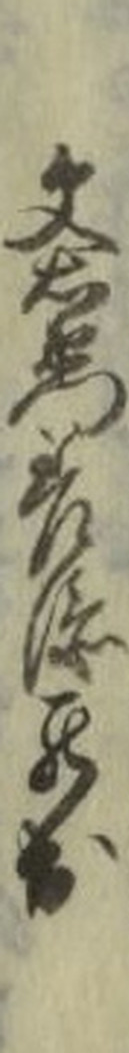文右衛門差添罷出
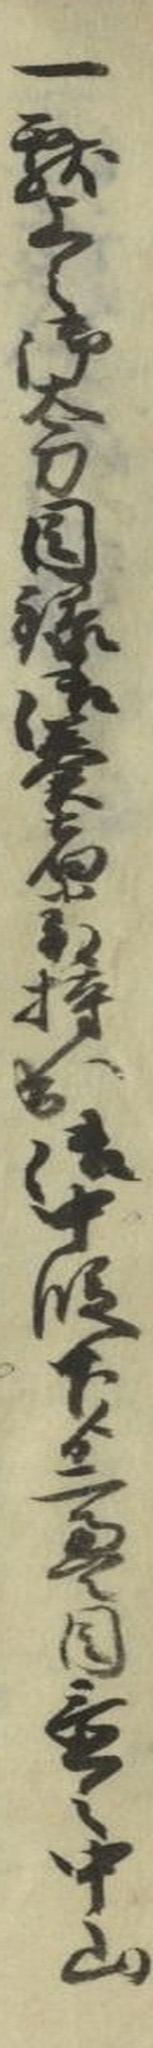一献上之御太刀目録御奏者番持出御中段下ゟ二畳目置之中山
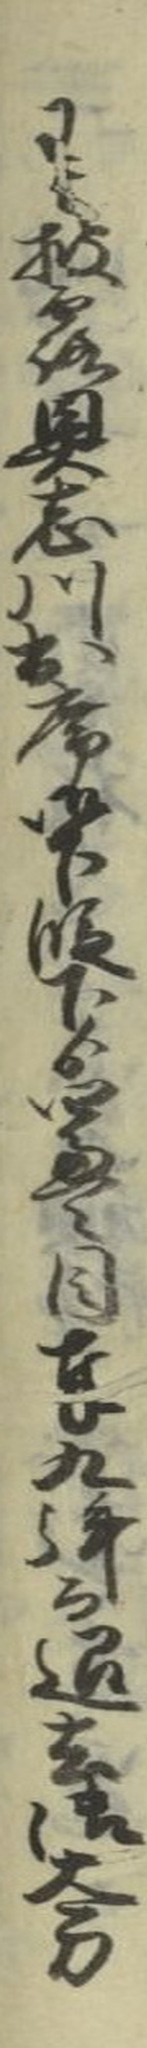王と披露具志川出席御下段下ゟ四畳目奉九拝而退去御太刀
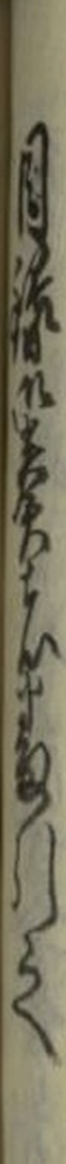目録御奏番引之
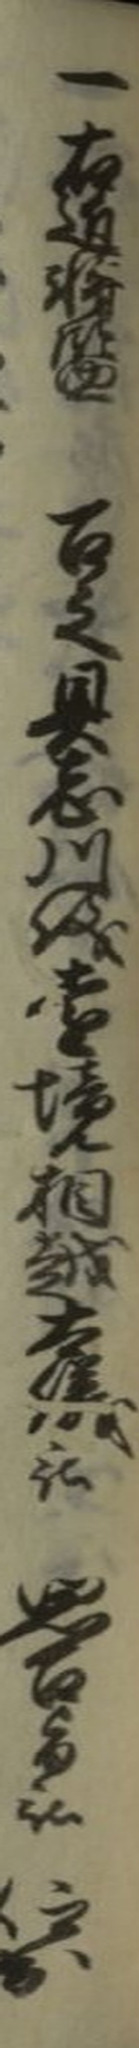一右近将監召之具志川儀遠境相越大儀被思召旨被仰出
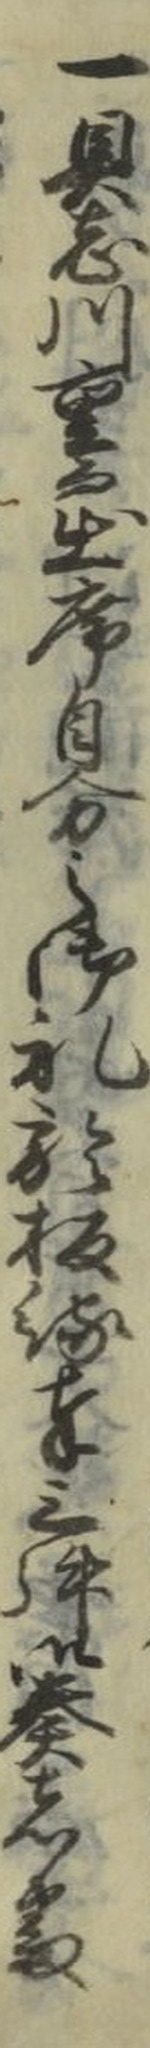一具志川重而出席自分之御礼於板縁奉三拝御者番
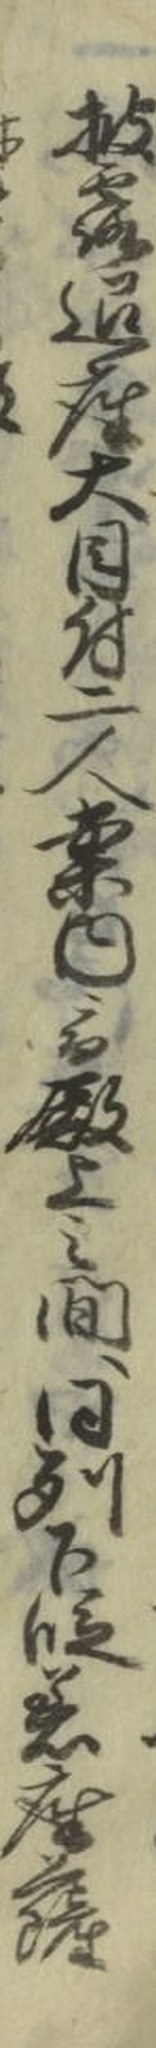披露退座大目付二人案内に而殿上之間へ同列下段着座
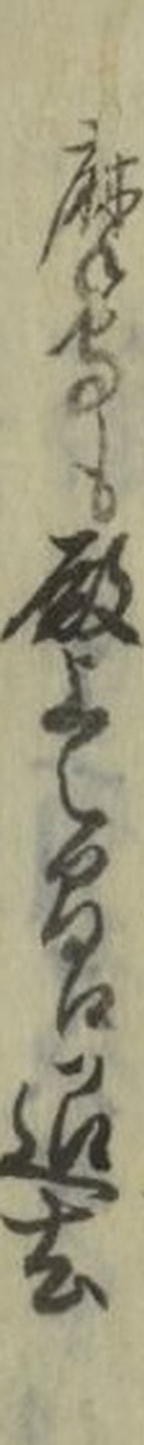摩守も殿上之間え退去
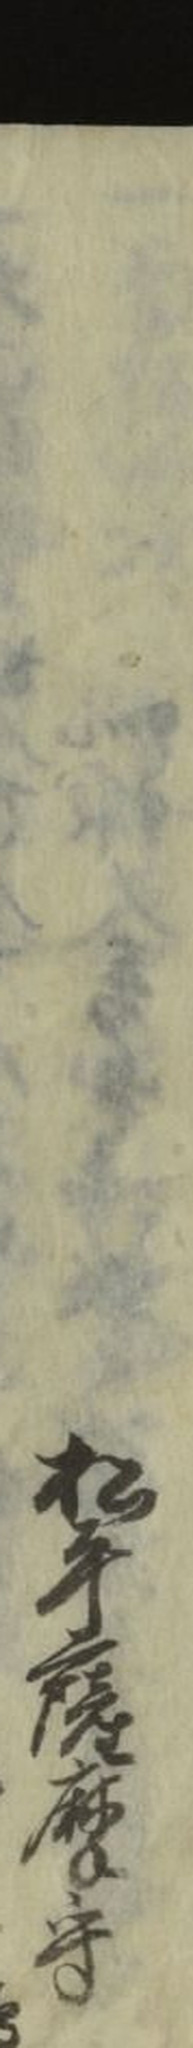松平薩摩守
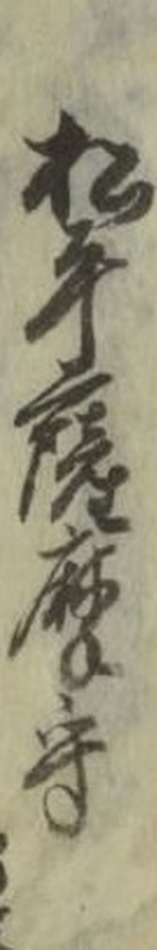松平薩摩守
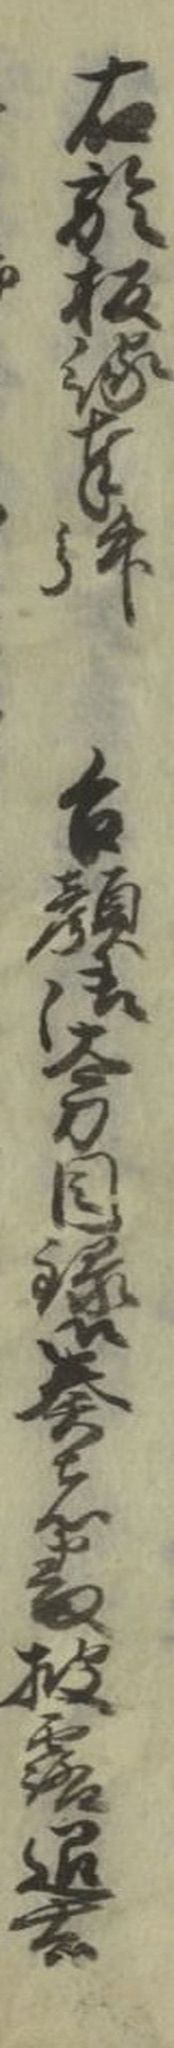右於板縁奉拝台顔御太刀目録御奏者番披露退去
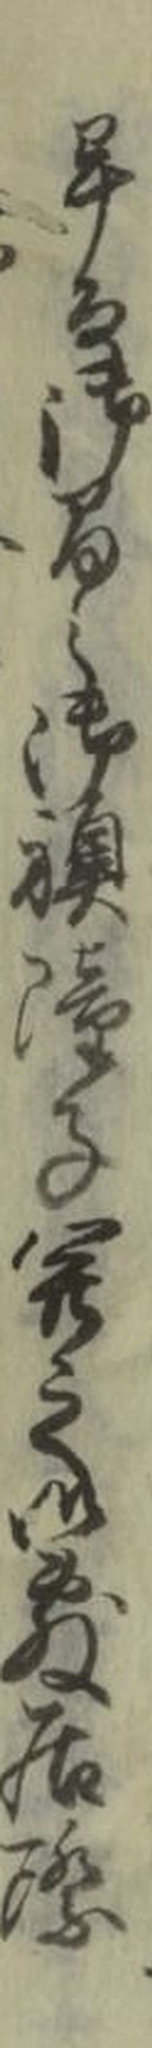畢而御局之御襖障子開之御敷居際
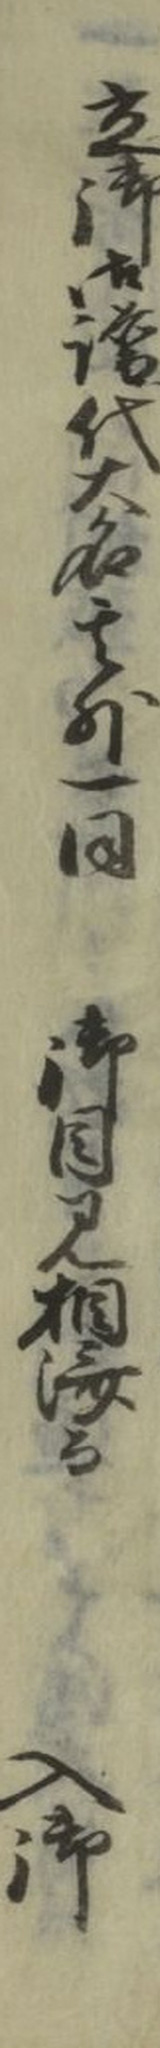立御御譜代大名其外一同御目見相済而入御
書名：琉球人来朝之記
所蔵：University of the Ryukyus Library
